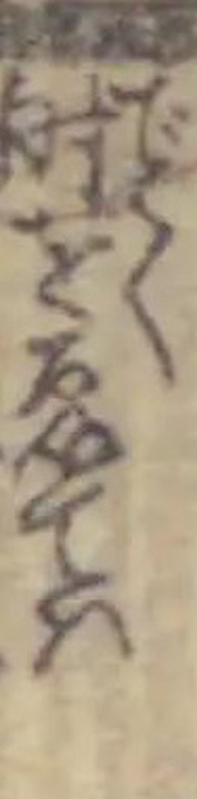時をゑては
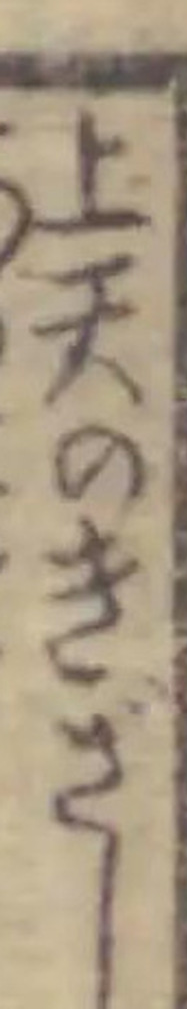上天のきざし
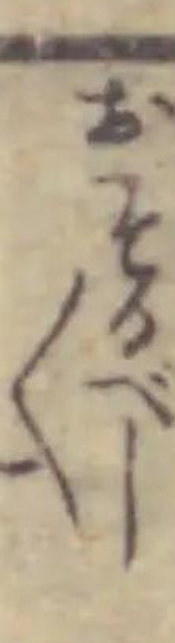おそるべし
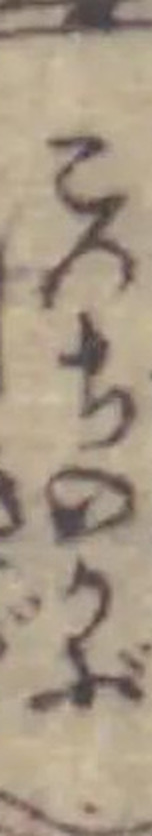こつちのかぶ
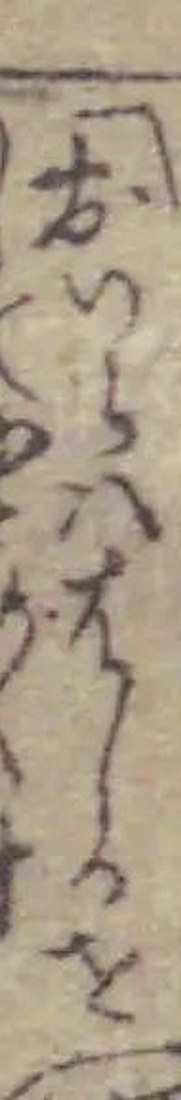〽おいらははしかを
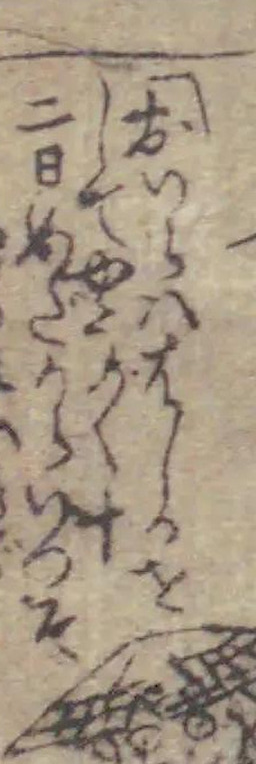二日めだからいつそ
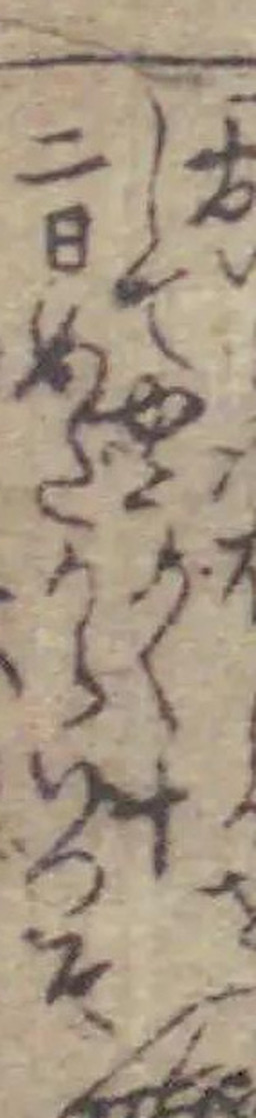二日めだからいつそ

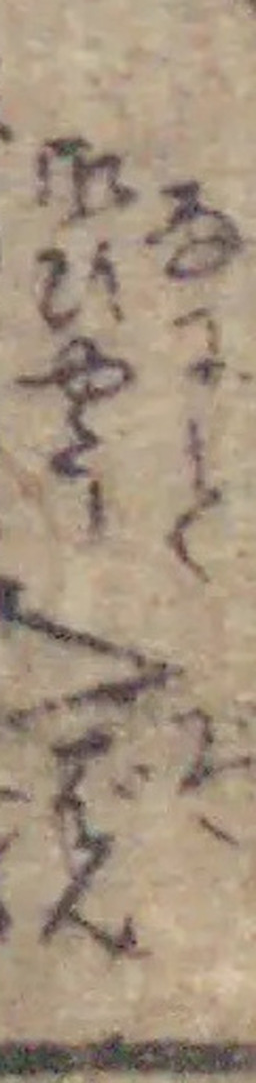御ひやうばん
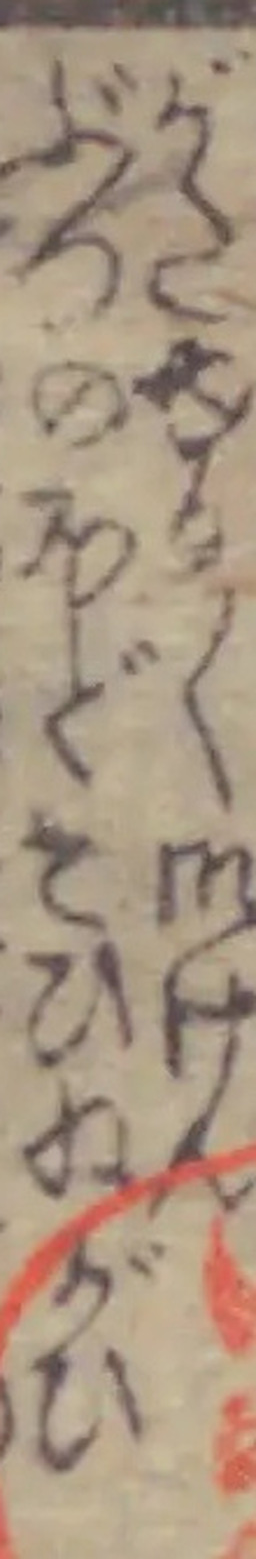ぶつのほどこひねがひ
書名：化物太平記 3巻
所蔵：国立国会図書館 National Diet Library, JAPAN
